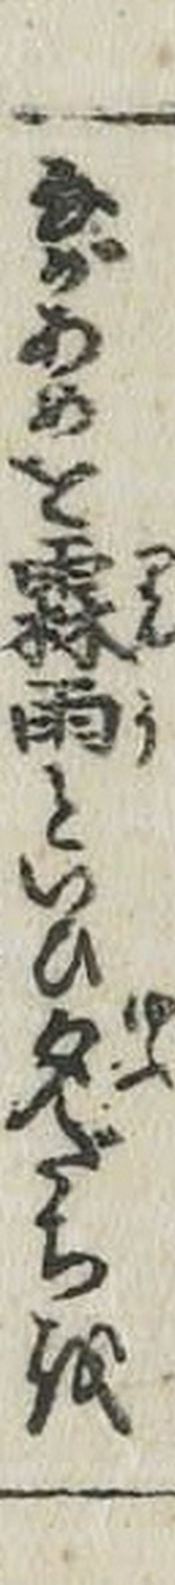ながあめを霖雨といひ夕だちを
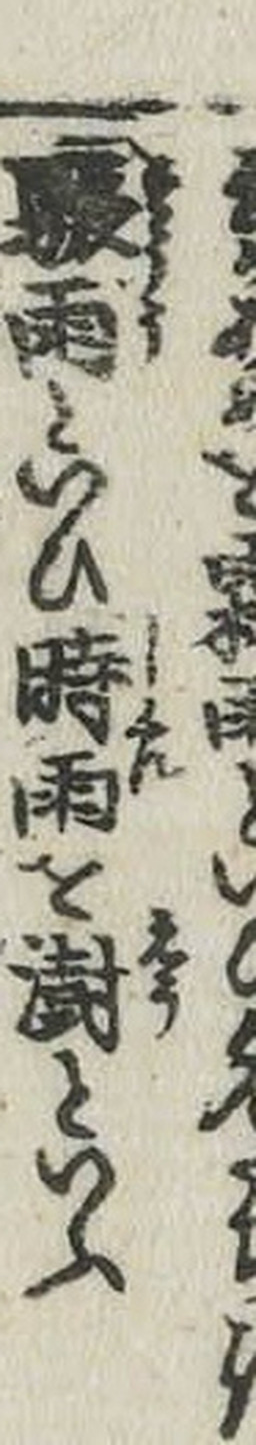驟雨といひ時雨を澍といふ
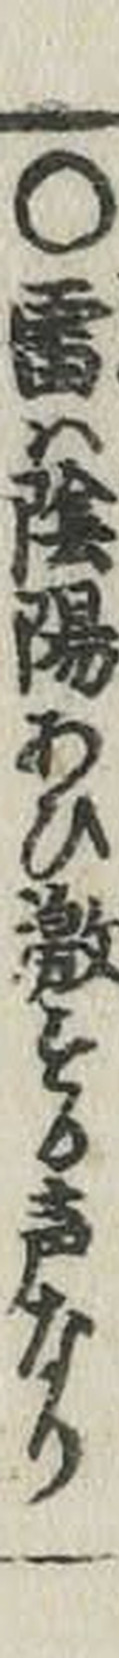○雷は陰陽あひ激する声なり
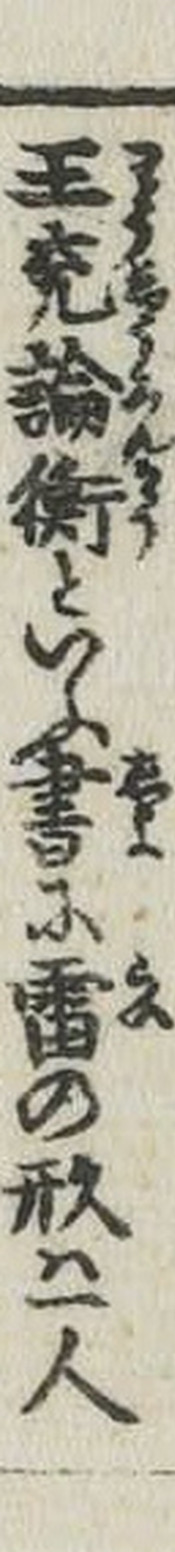王充論衡といふ書に雷の形は一人
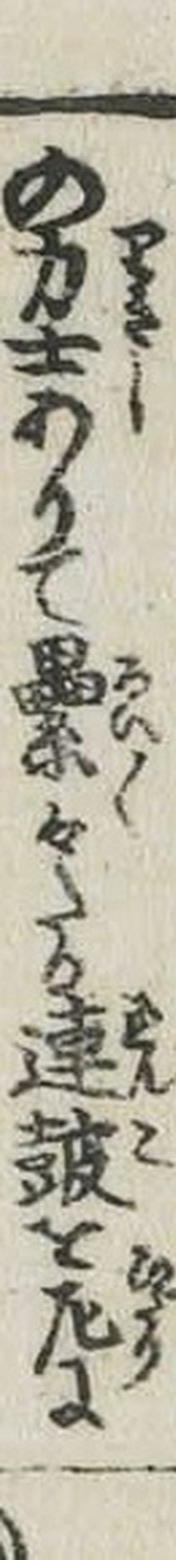の力士ありて累々たる連鼓を左に
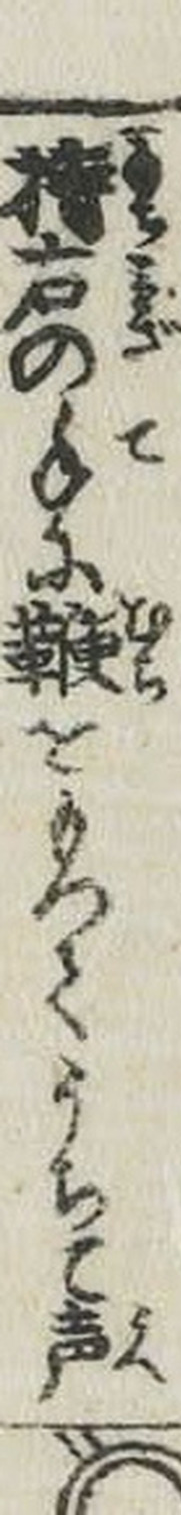持右の手に鞭をもつてうちて声
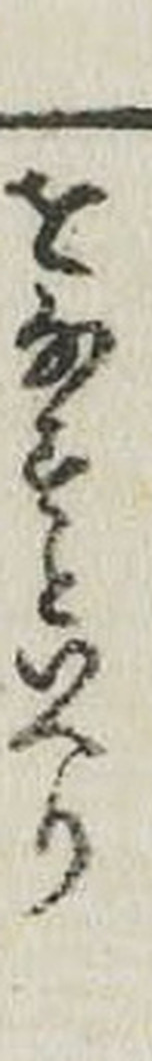をなすといへり
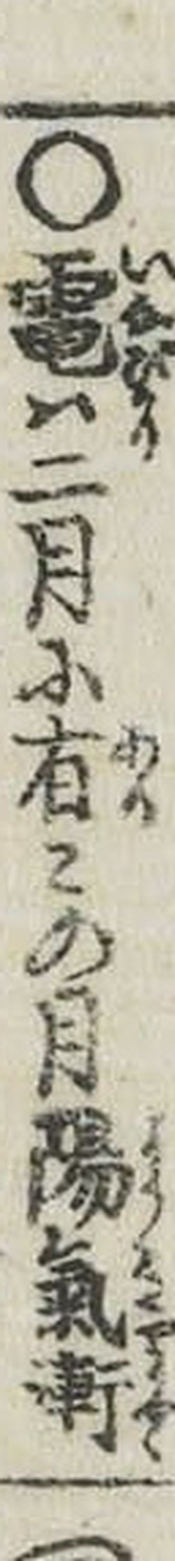○電は二月に有この月陽気漸
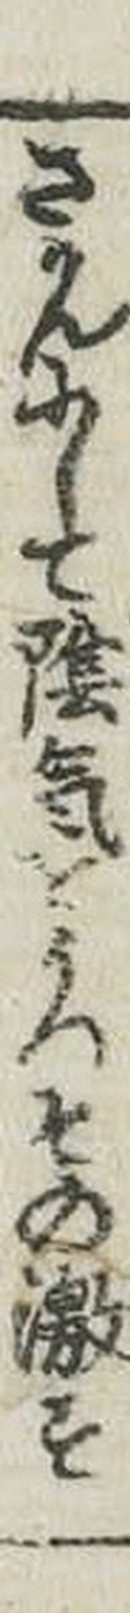さかんにして陰気をうつその激す
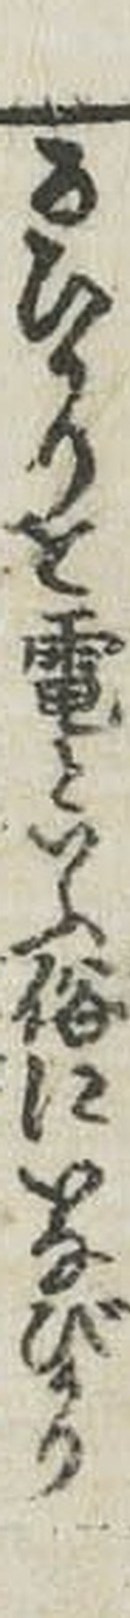るひかりを電といふ俗にいなびかり
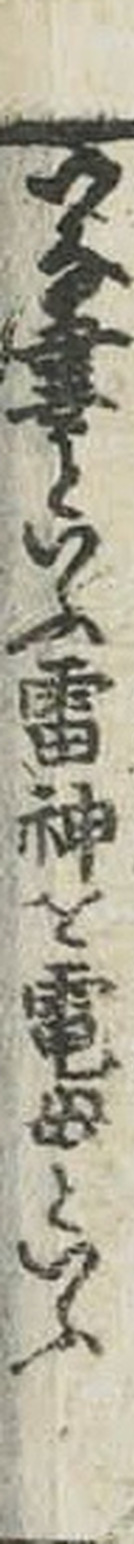いな妻といふ雷神を電母といふ
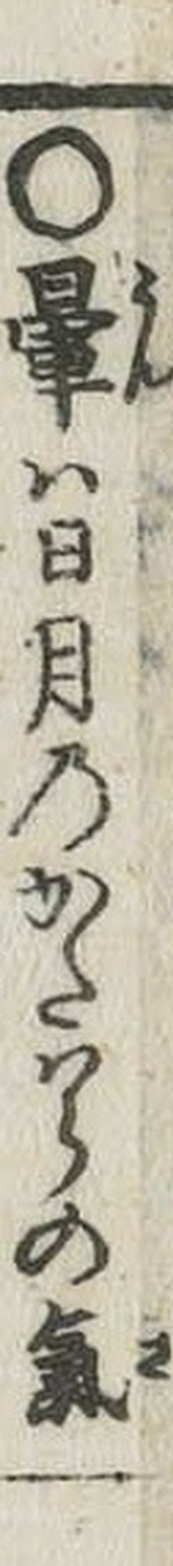○暈は日月のかたはらの気
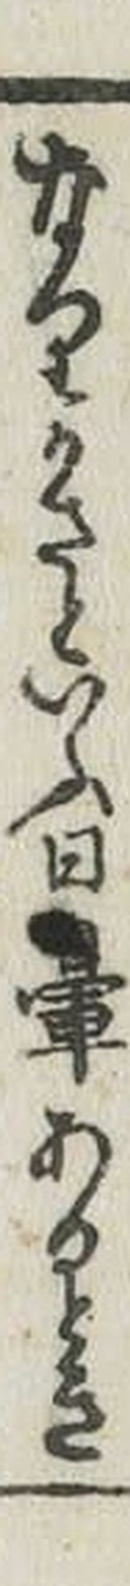なりかさといふ日暈あるとき
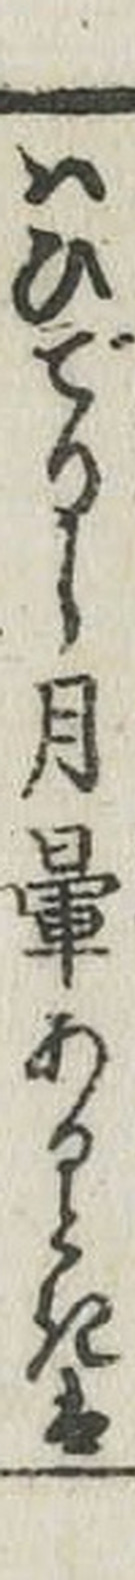はひでりし月暈あるときは
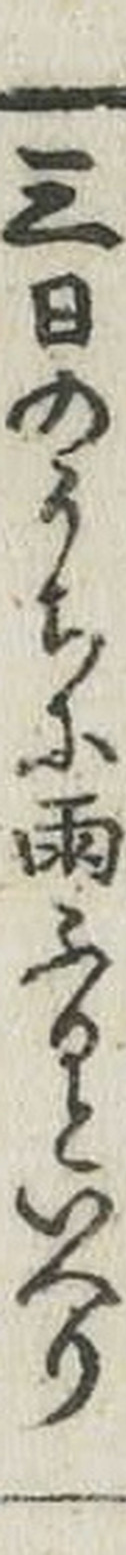三日のうちに雨ふるといへり
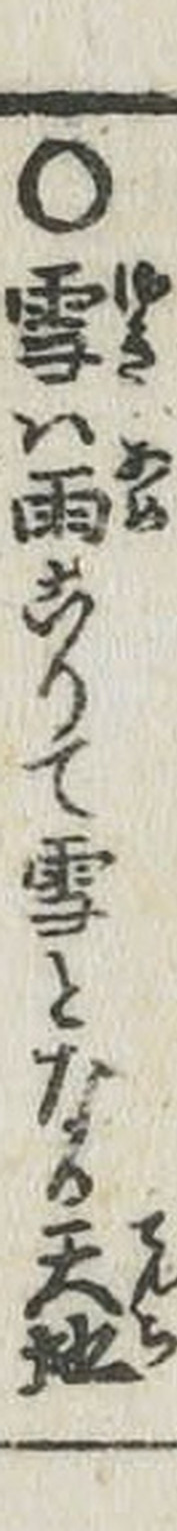○雪は雨こりて雪となる天地
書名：増補頭書訓蒙図彙大成 10巻 2:巻之1-3
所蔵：東京学芸大学教育コンテンツアーカイブ
